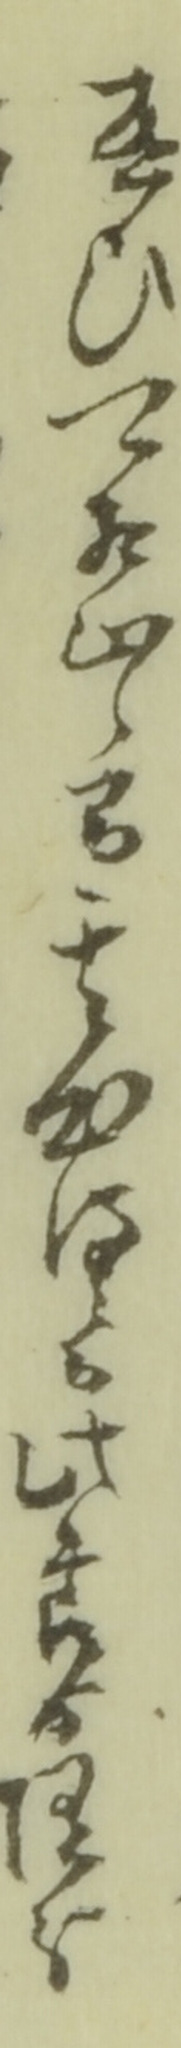直ひ可相正候間其心得に而此節よりと
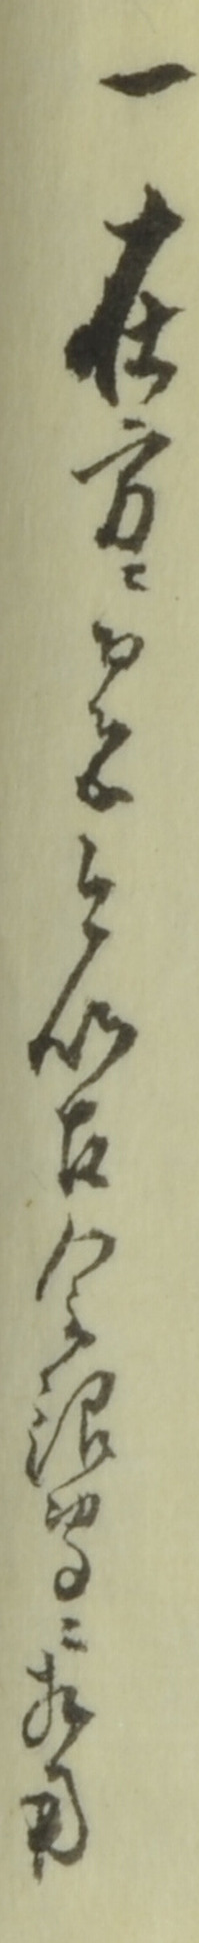一在方二而者今以古金銀決二相用
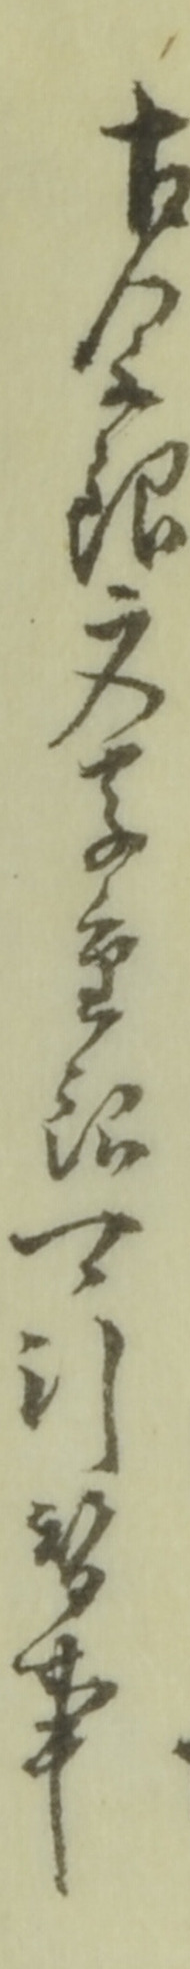古金銀文字銀様可引替事

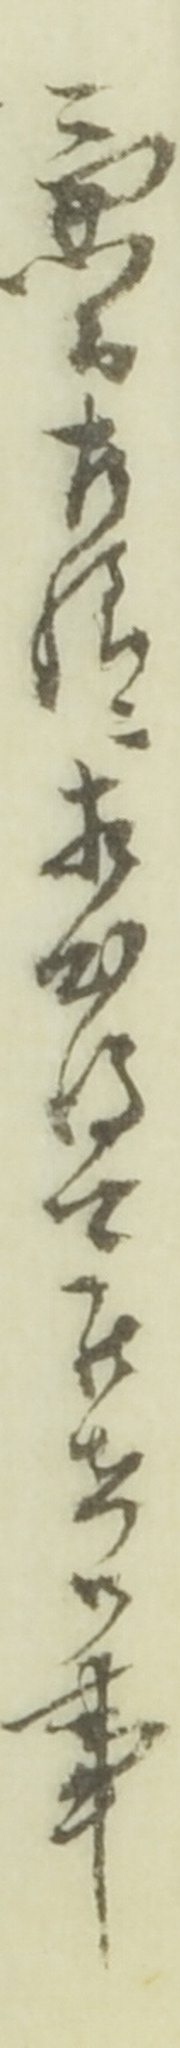兼而左様に相心得可罷有候事
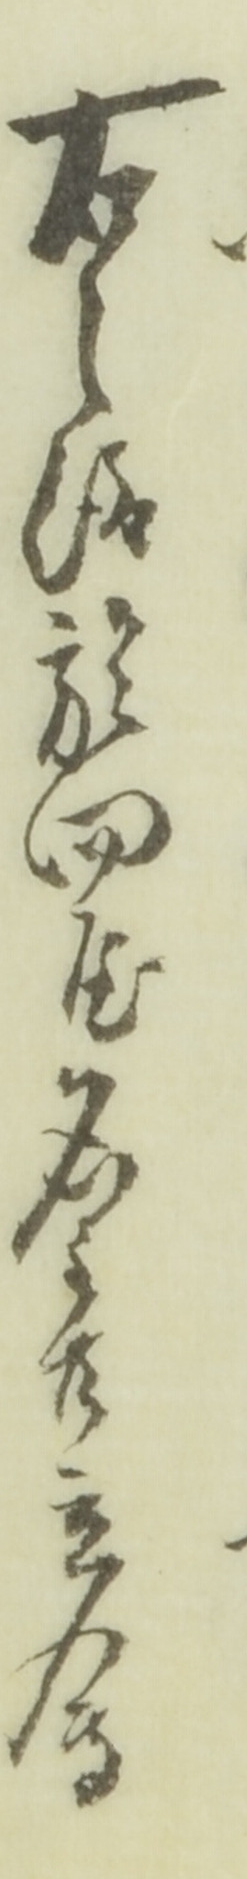右之儀於問屋名主共立会
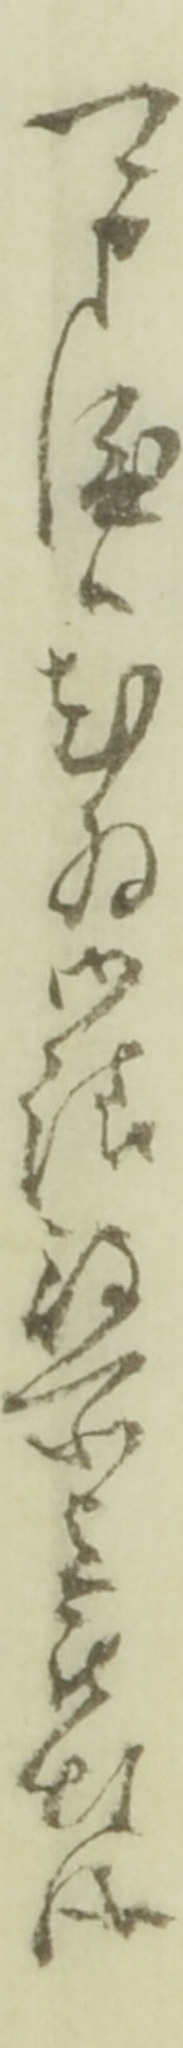可申渡候尤為御請役所迄罷出候
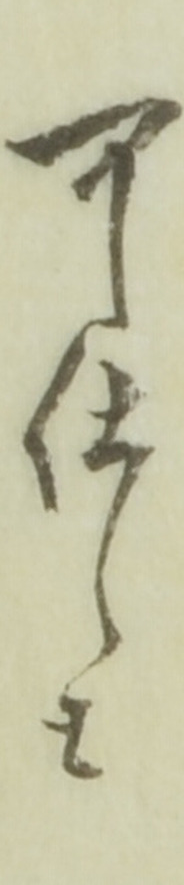可仕候以上
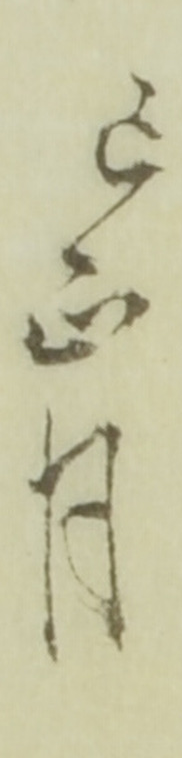巳正月
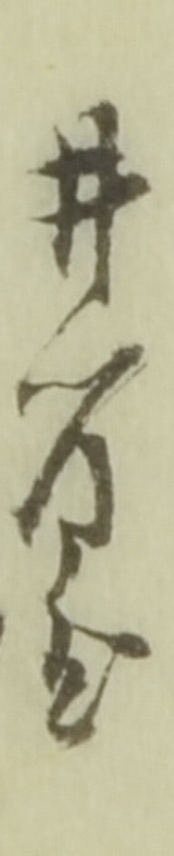井万屋
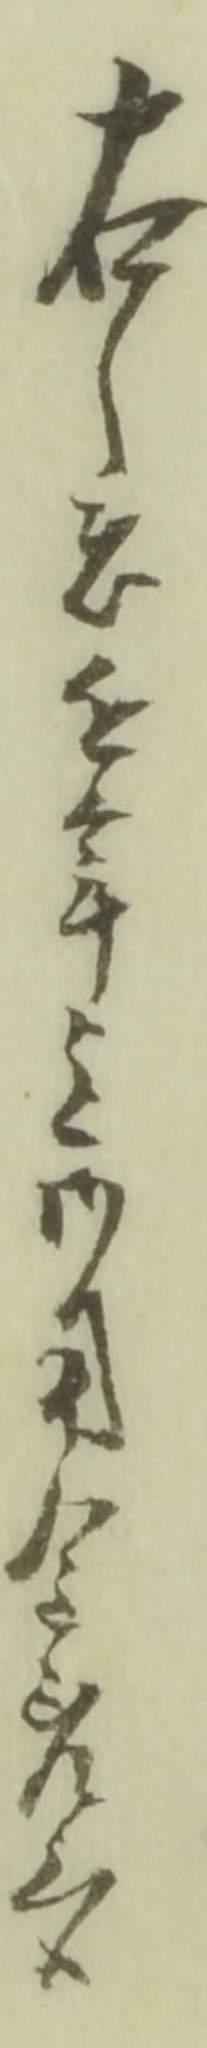右之者近年迄御用金差上候
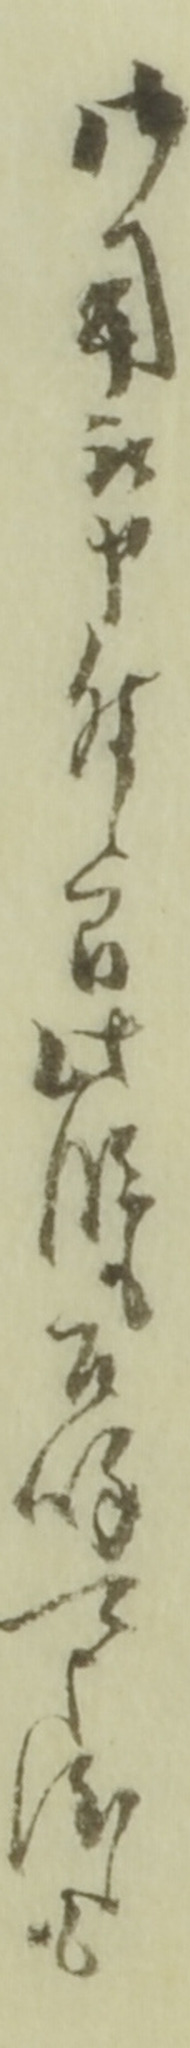御用被申付候間此段も召呼可申渡候已上
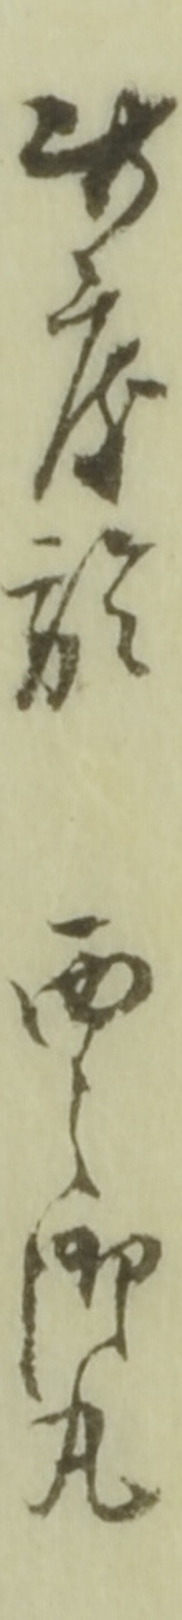此度於西之御丸
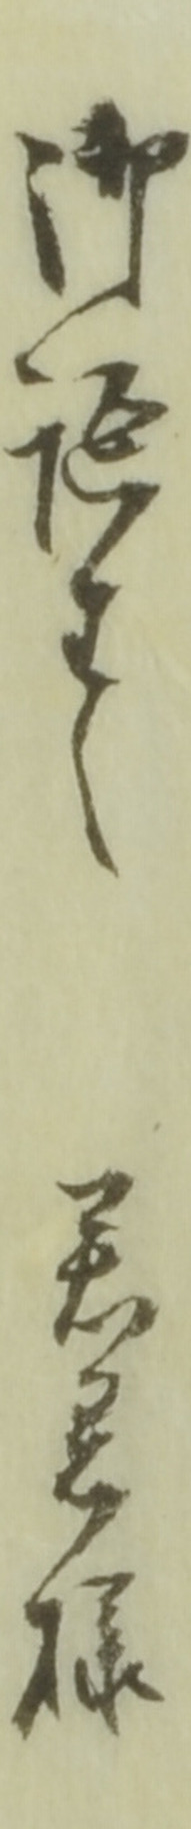御誕生之若君様
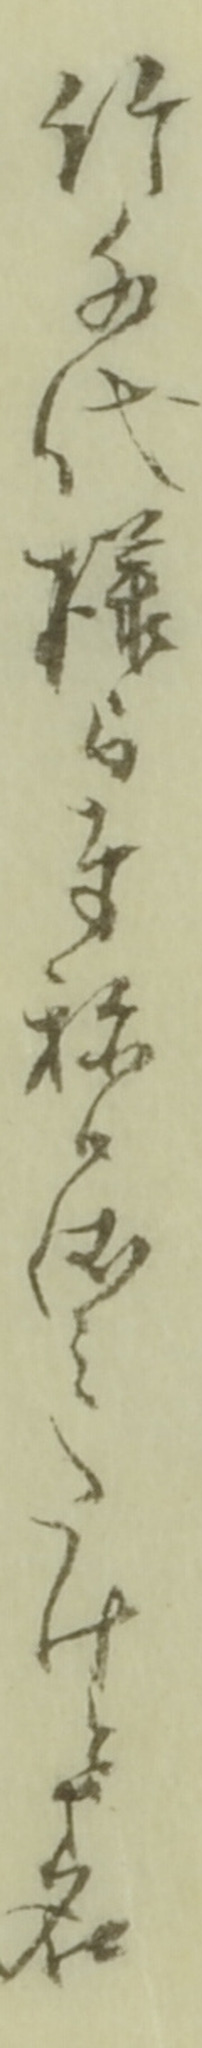竹千代様被奉称候依之たけと申名
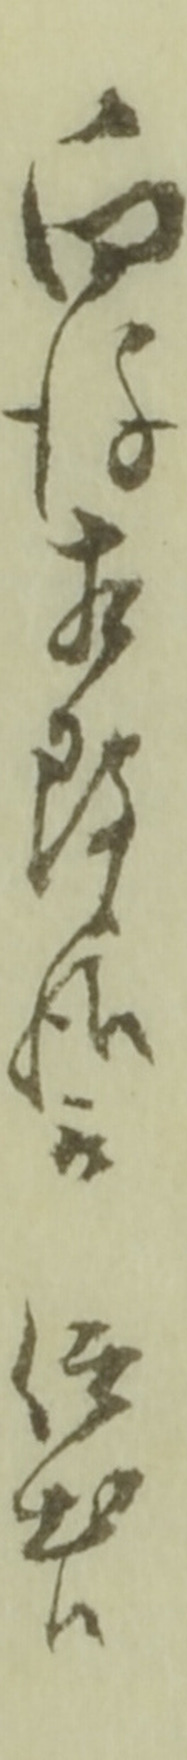向後相改候様被仰出候
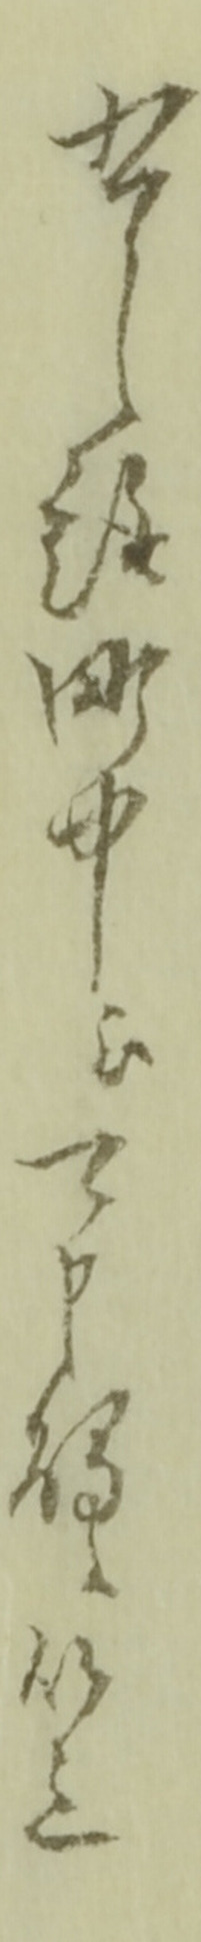右之趣町中江可申触候以上
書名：御公儀様御領主様御触書控
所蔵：伊那市立高遠町図書館・合同会社AMANE
